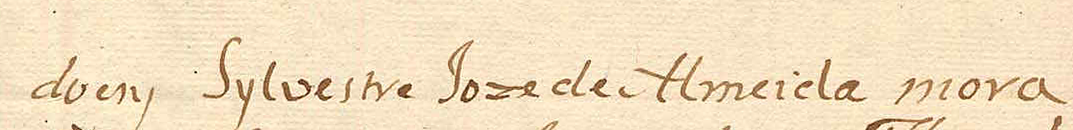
doens Sylvestre Ioze de Almeida mora
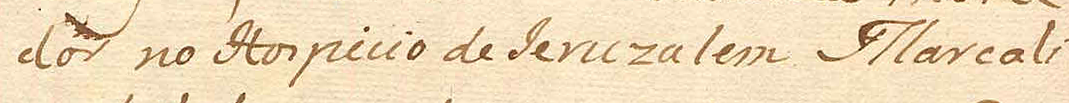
dor no Hospicio de Ieruzalem Marcoli
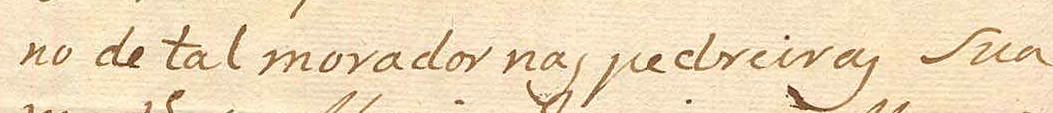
no de tal morador nas pedreiras sua
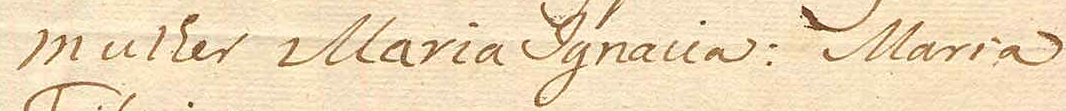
mulher Maria Ignacia: Maria
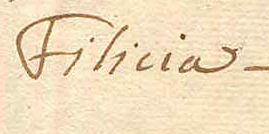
Filicia-
